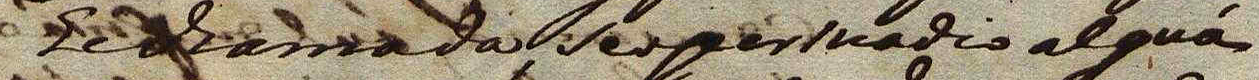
he chamada, se o persuadio alguā
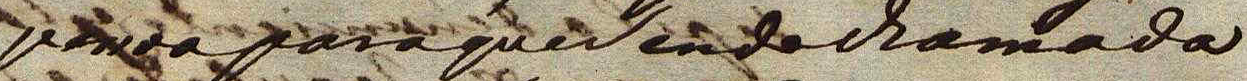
pessoa para que sendo chamada
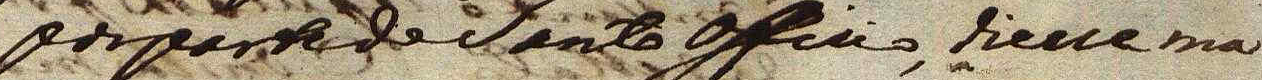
por parte do Santo officio, dicese ma
